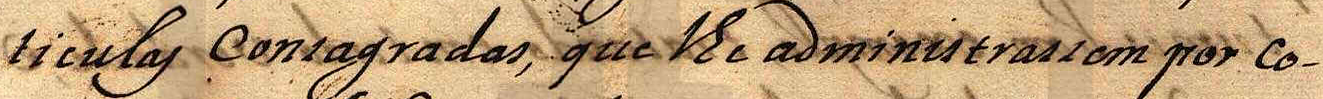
ticulas consagradas, que lhe administrassem por co
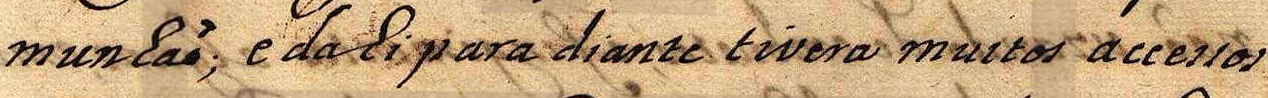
munhaõ, e dahi para diante tivera muitos acessos
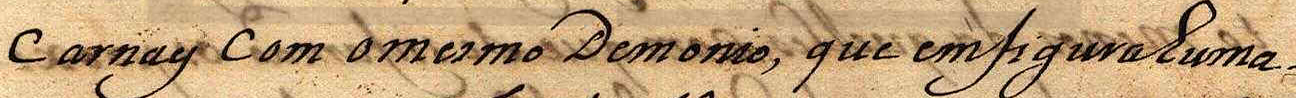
Carnaes com o mesmo Demonio, que em figura huma
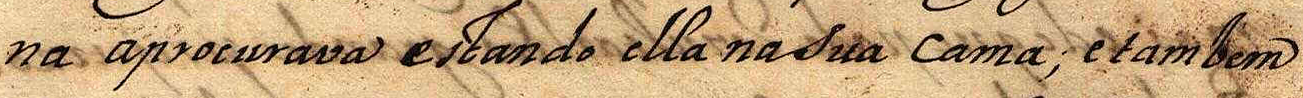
na a procurava estando ella na sua cama e também
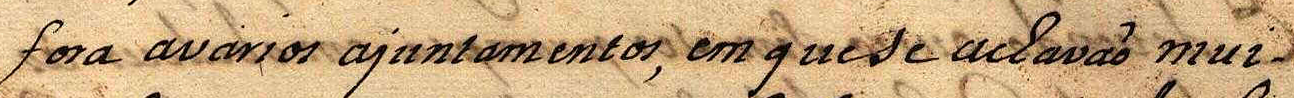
fora a varios ajuntamentos, em que se achavaõ mui
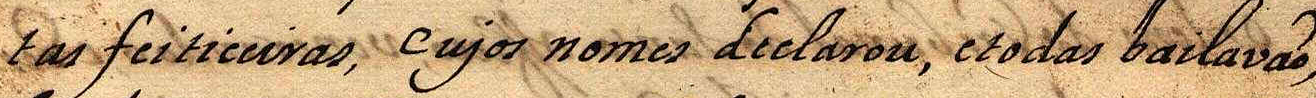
tas feiticeiras, cujos nomes declarou, e todas bailavão,
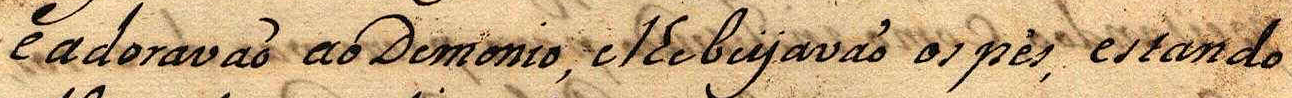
e adoravaõ ao Demonio, e lhe beijavaõ os pés, estando
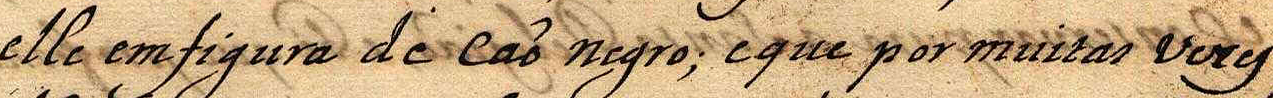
elle em figura de caõ negro; e que por muitas vezes
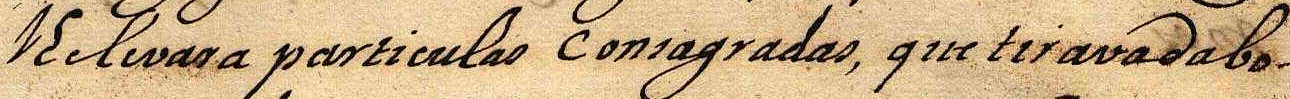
lhe levara particulas consagradas, que tirava da bo
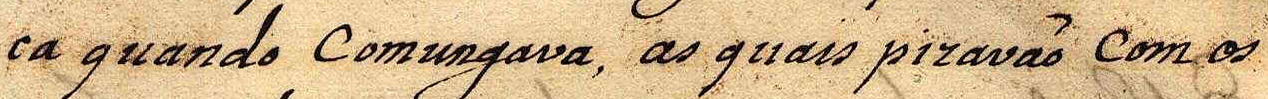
ca quando Comungava, as quais pizavão com os
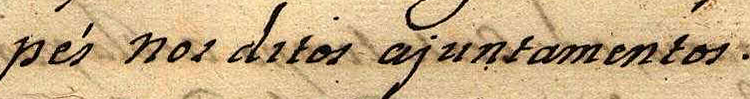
pés nos ditos ajuntamentos.
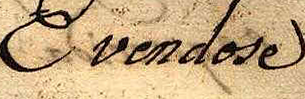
E vendo se
